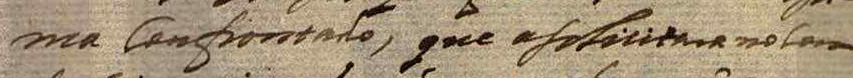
ma Confrontado, que a solicitara no con
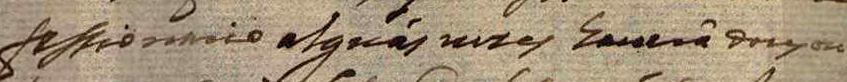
fessionario alguās uezes hauerá dous ou
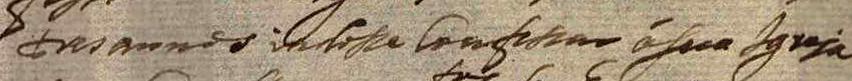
tres anos indosse Confessar á sua Igreja
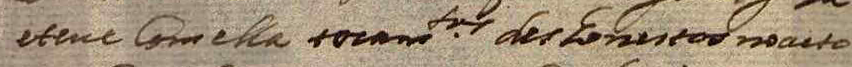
e teue Com ella tocam.tos deshonestos no acto
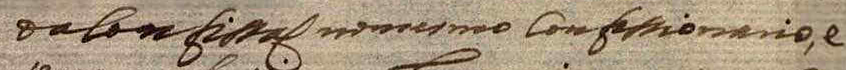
da Confissaꝭ no mesmo confessionario, e
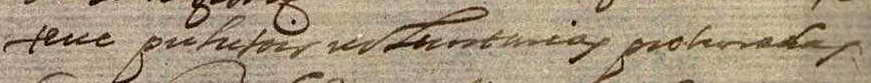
teue pulusois uoluntarias procuradas
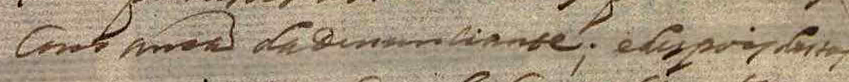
Com a maõ da denunciante; e despois destas
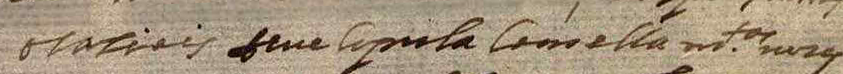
ocaziois teue Copula Com ella m.tas uezes
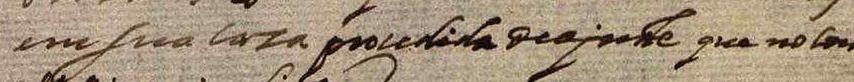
em sua caza procedida de ajuste que no con
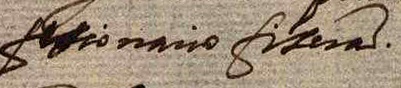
fessionario fizeraõ.
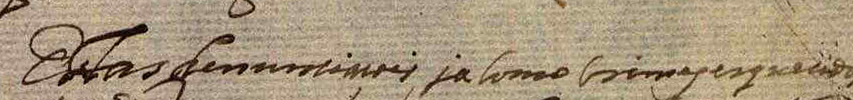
Estas denunciaçois, ja como crimes esquecidos
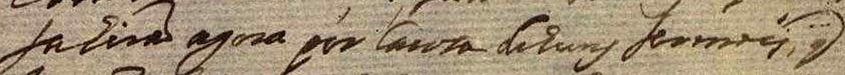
sahiraõ agora por cauza de huns sermois, q̄
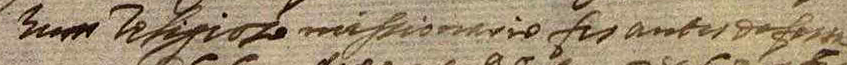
hum Religiozo missionario fes antes da festa
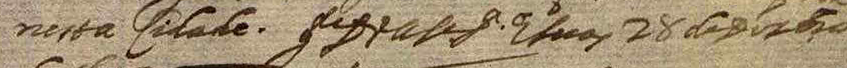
nesta Cidade. gde Ds̄ a v sa. Eluas 28 de Dezbro
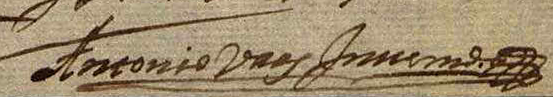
Antonio Vaas Jnuerno
